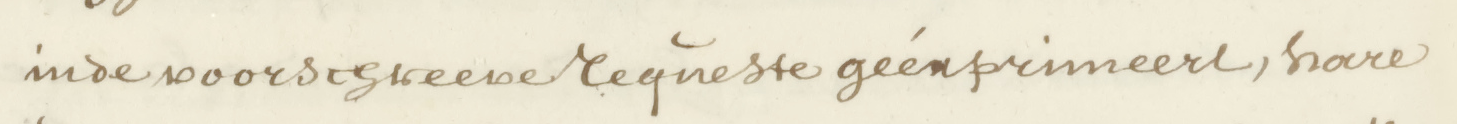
inde voorschreeve requeste geéxprimeert, hare
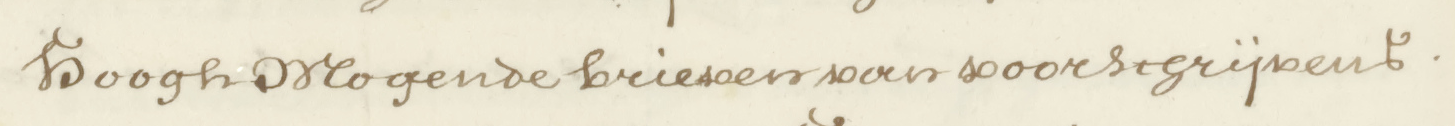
Hoogh Mogende brieven van voorschrijvens
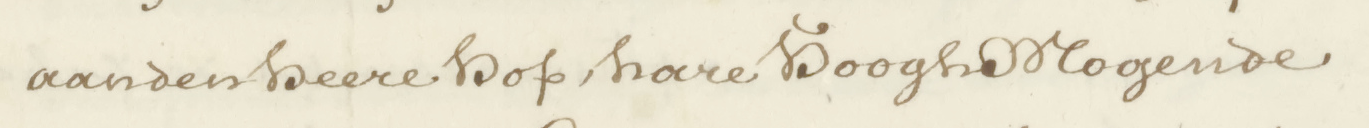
aan den heere Hop, hare Hoogh Mogende
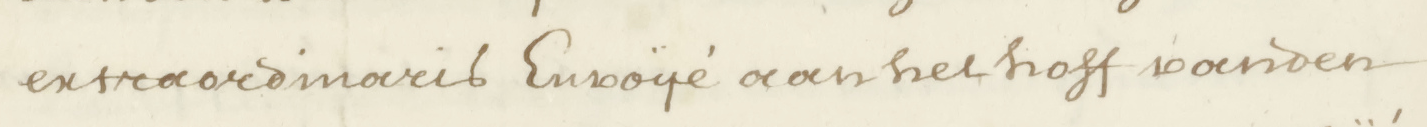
extraordinaris Envoijé aan het hoff vanden
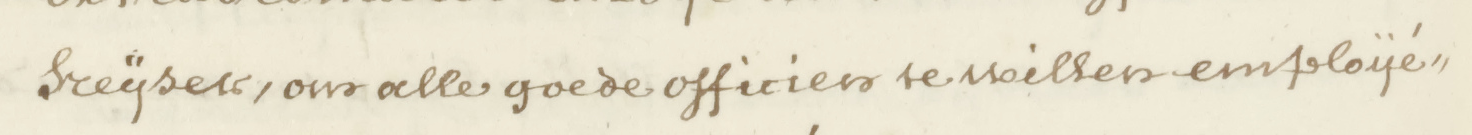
keijser, om alle goede officien te willen emploijé„
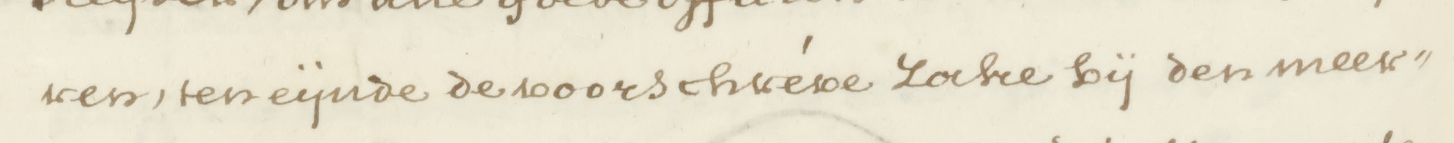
ren, ten eijnde de voorschreve zake bij den meer„
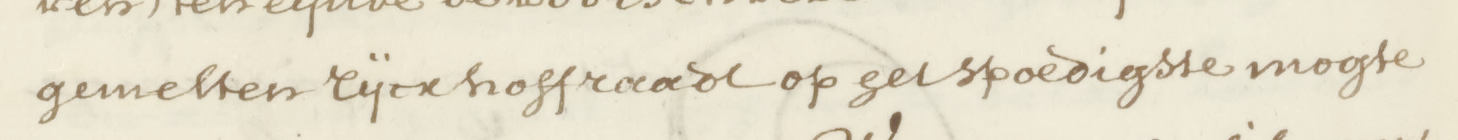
gemelten rijcxhoffraadt op het spoedigste mogte
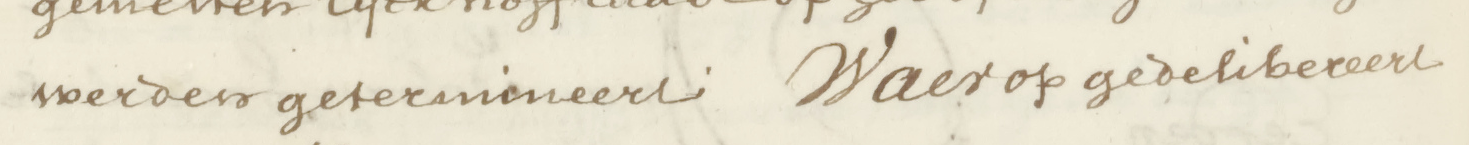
werden getermineert. Waer op gedelibereert
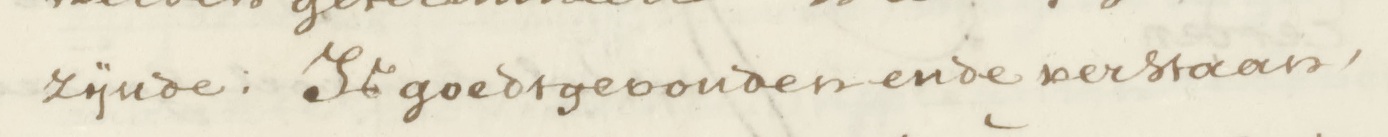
zijnde: Is goedtgevonden ende verstaan,
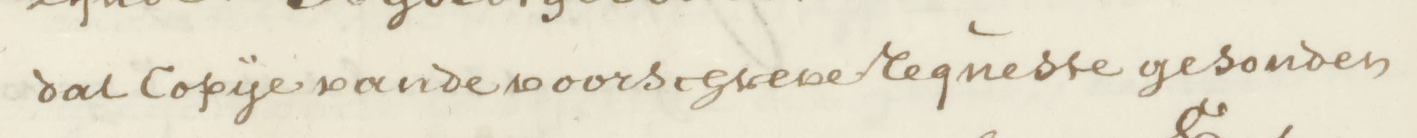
dat Copije vande voorschreve requeste gesonden
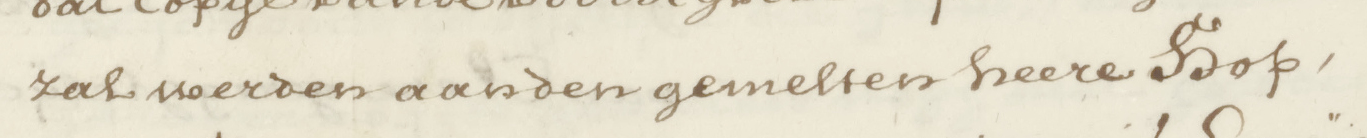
zal werden aan den gemelten heere Hop,
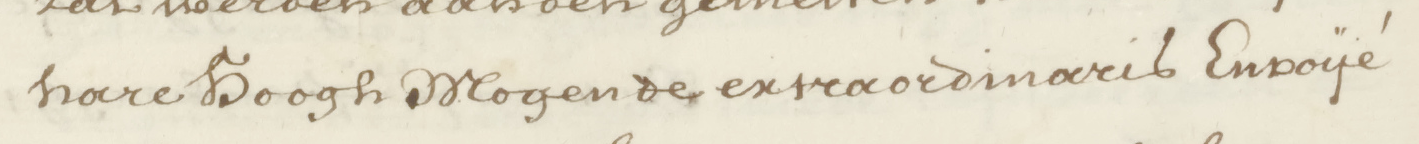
hare Hoogh Mogende extraordinaris Envoijé
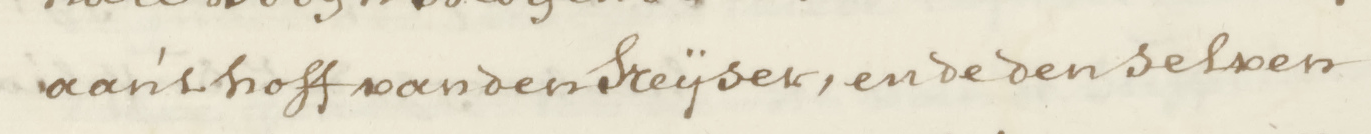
aan 't hoff van den Keijser, ende denselven
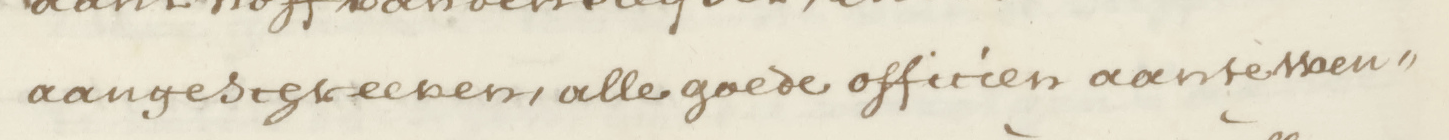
aangeschreeven, alle goede officien aan te wen„
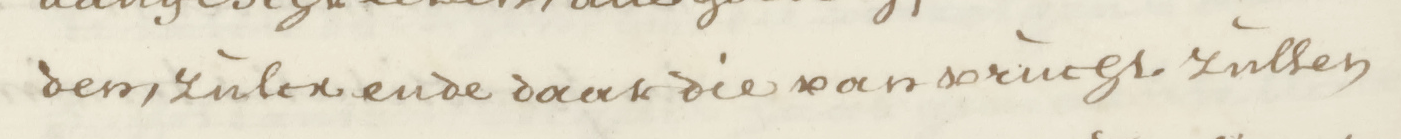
den, zulcx ende daar die van vrucht zullen
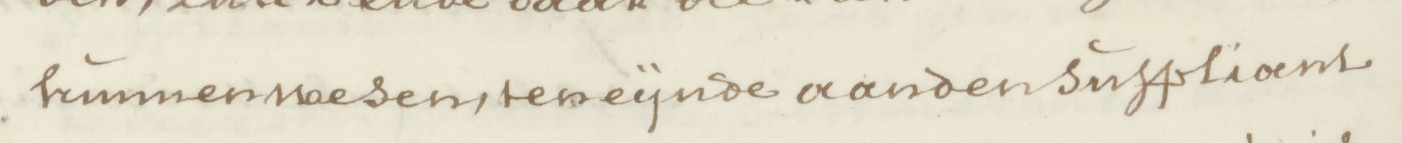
kunnen wesen, ten eijnde aanden suppliant
